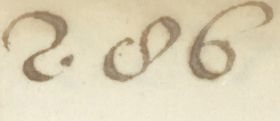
286
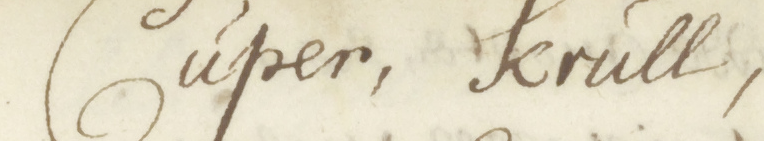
Cuper, Krul,.
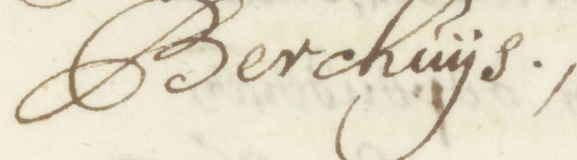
Berchuijs.
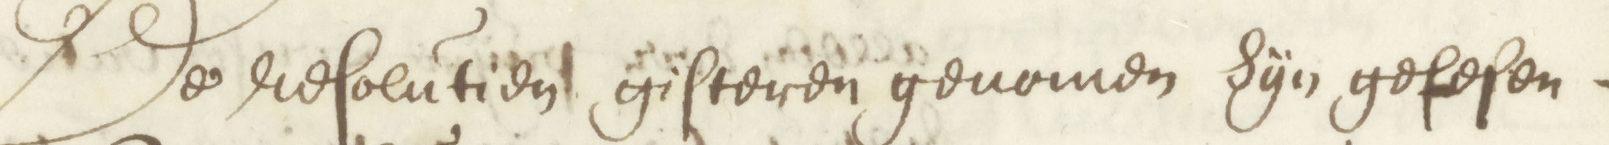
De resolutien gisteren genomen sijn gelesen
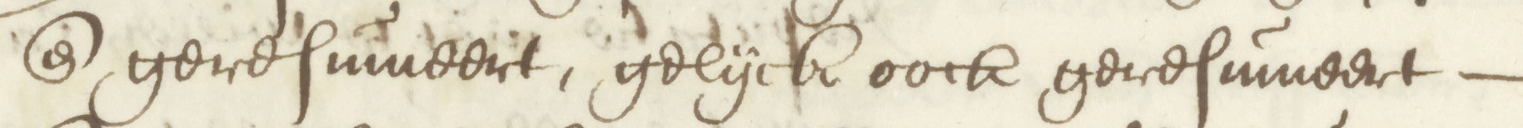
& geresumeert, gelijck oock geresumeert-
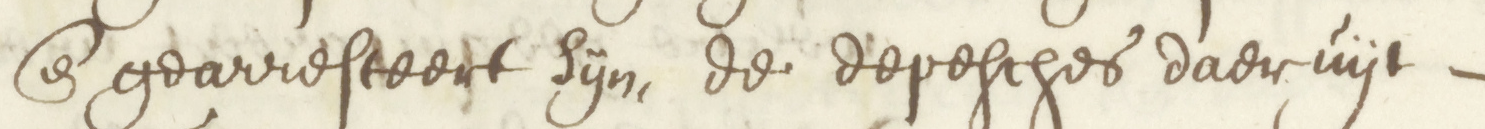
& gearresteert sijn, de depesches daer uijt -
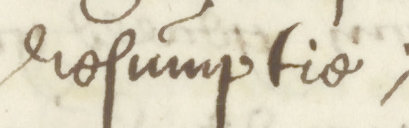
resumptie.
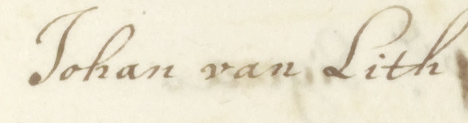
Johan van Lith
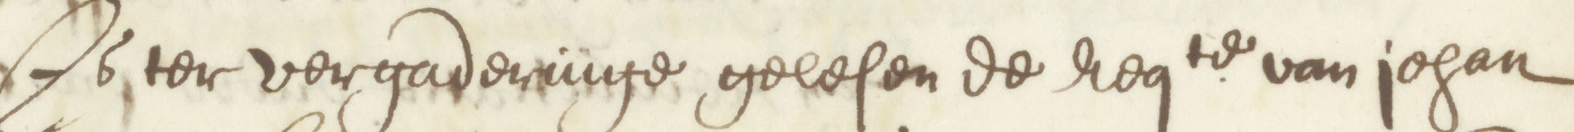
Is ter vergaderinge gelesen de reqte. van johan
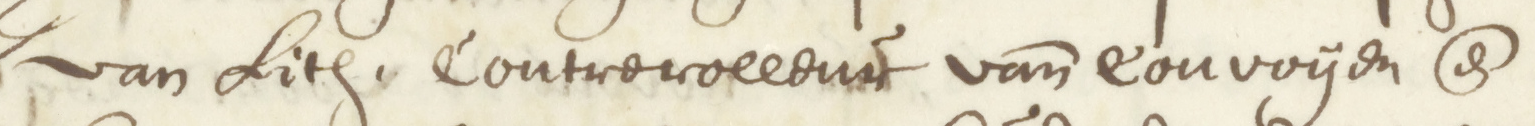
van Lith, Contrerolleur van Convoijen &
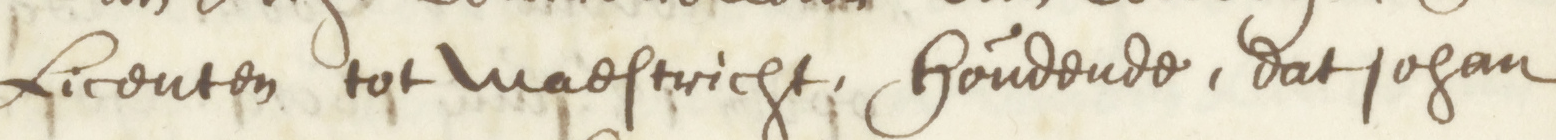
Licenten tot maestricht, houdende, dat johan
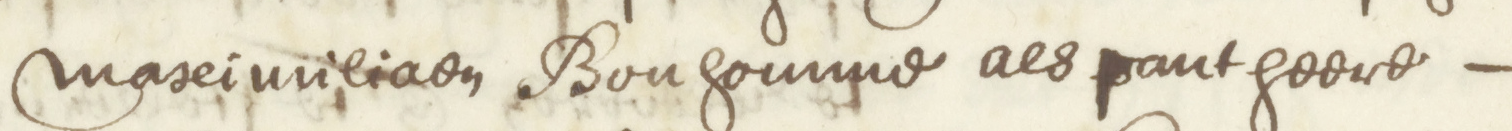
Maximiliaen Bonhomme als pant heere -
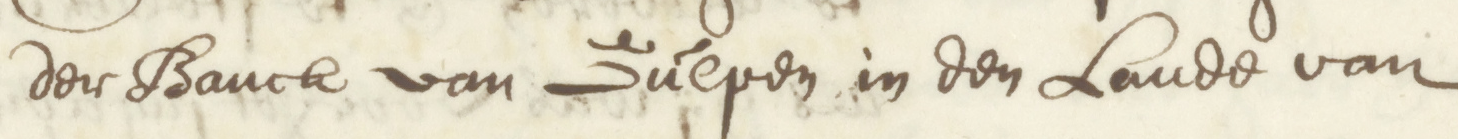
der Banck van Gulpen in den Lande van
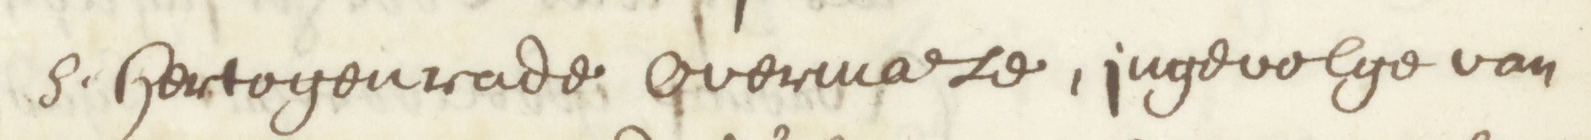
s' Hertogenrade Overmaze, ingevolge van
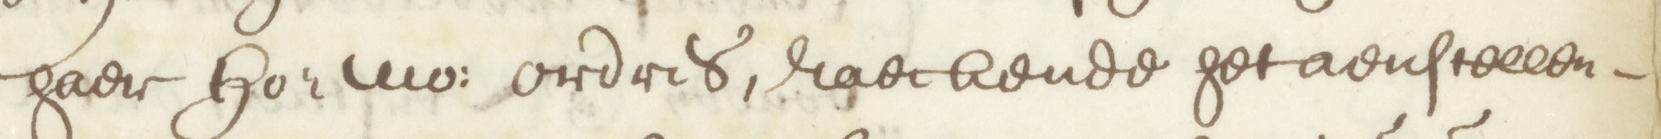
haer Ho:Mo: ordres, raeckende het aenstellen-
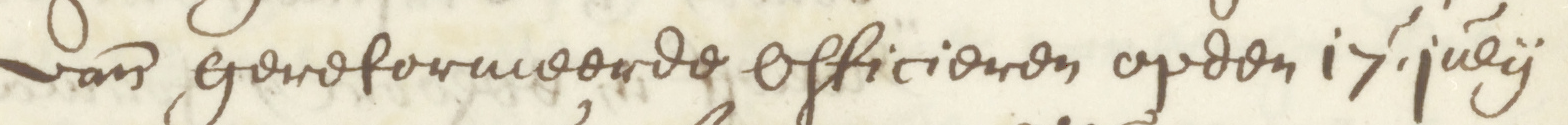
van gereformeerde officieren opden 17e julij
